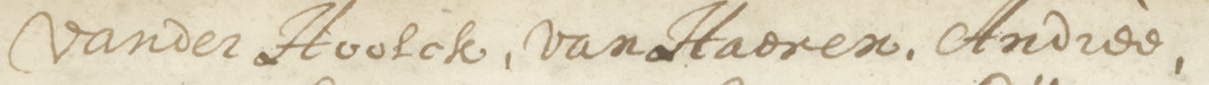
vander Hoolck, van Haeren, Andreè,
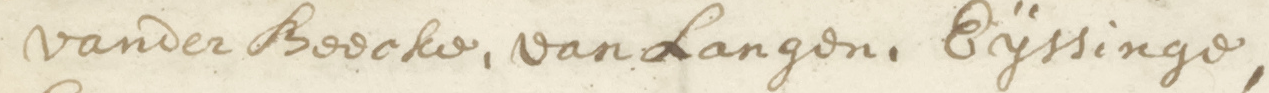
vander Beecke, van Langen, Eijssinge,
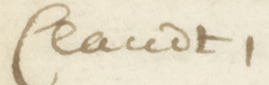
Clandt.
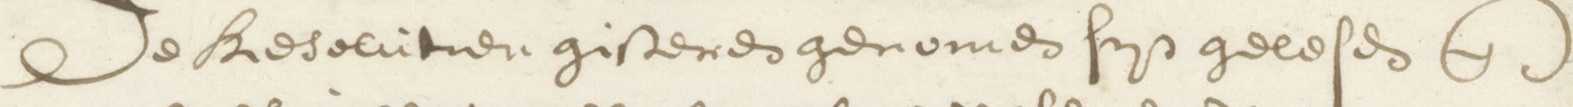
De Resolutien gisteren genomen syn gelesen &
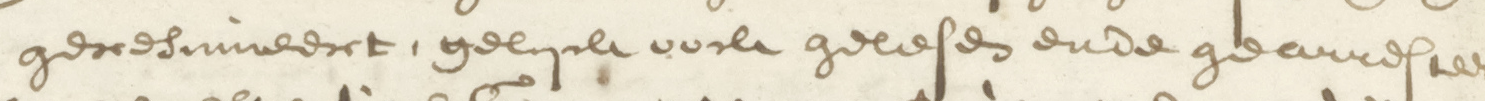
geresumeert, gelyck oock gelesen ende gearresteert
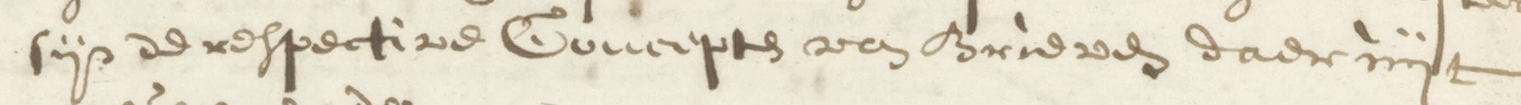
sijn de respective Concepten van Brieven daer uijt
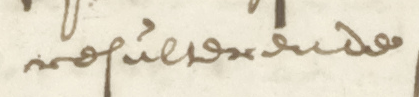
resulterende.
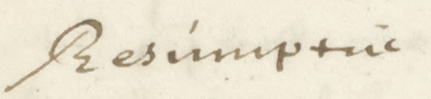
Resumptie
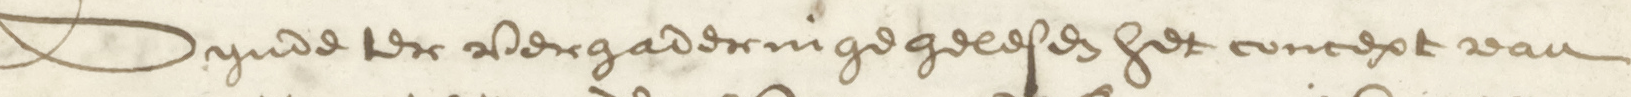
Synde ter Vergaderinge gelesen het concept van
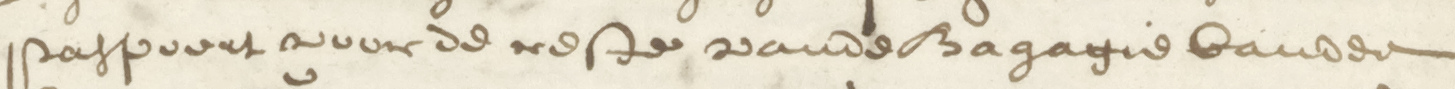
paspoort voor de reste vande Bagagie vanden
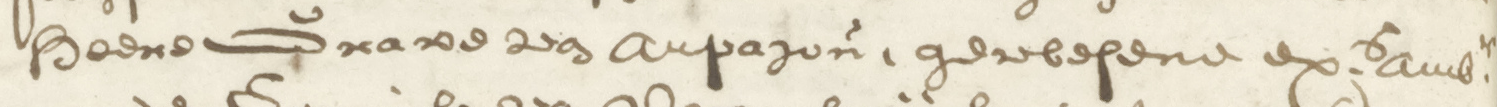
Heere Grave van Arpajou, gewesene exs. ambr.
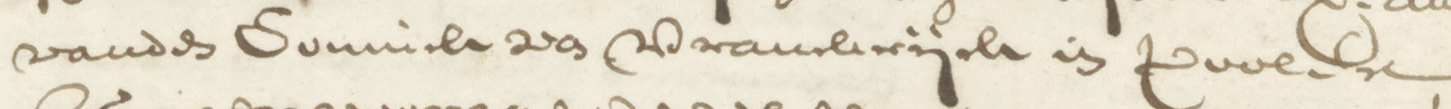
vanden Coninck van Vranckrijck in Poolen.
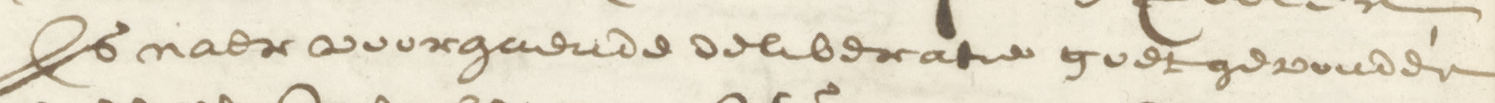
Is naer voorgaende deliberatie goetgevonden
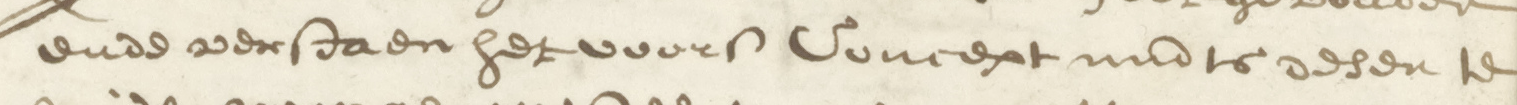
ende verstaen het voors Concept midts desen te
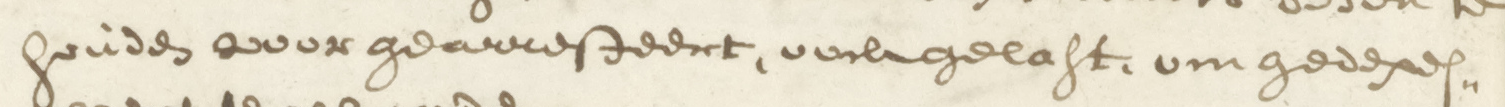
houden voor gearresteert, oock gelast, om gedepes„
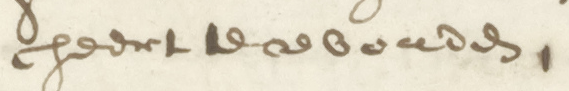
cheert te worden.
